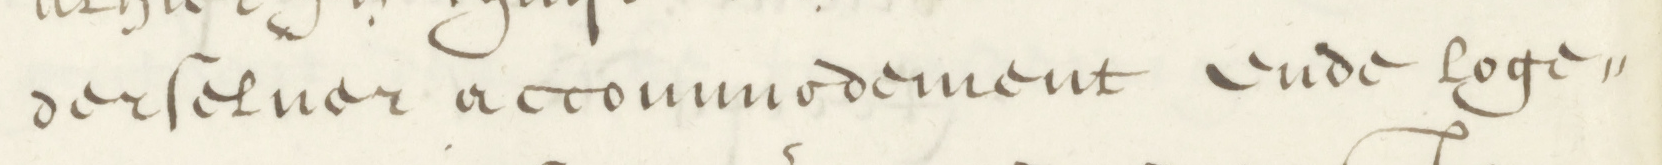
derseluer accommodement ende loge,,
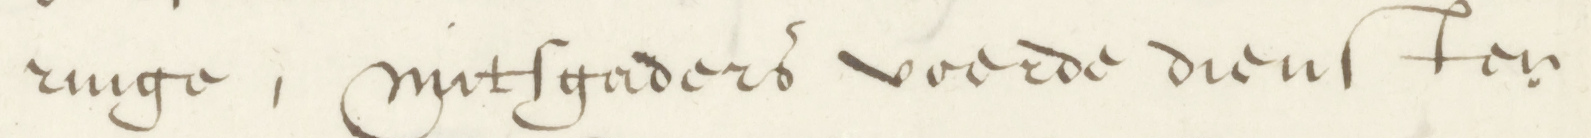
ringe, mitsgaders voerde diensten
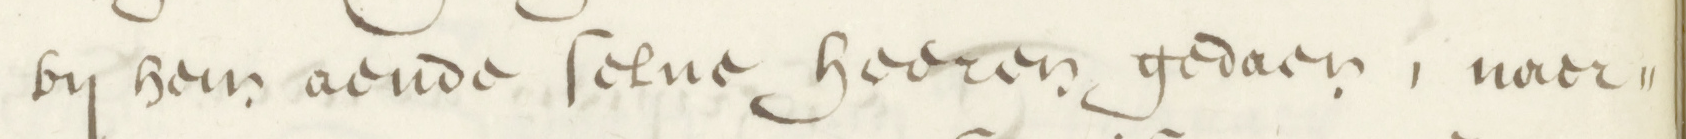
by hem aende selue heeren gedaen, naer,,
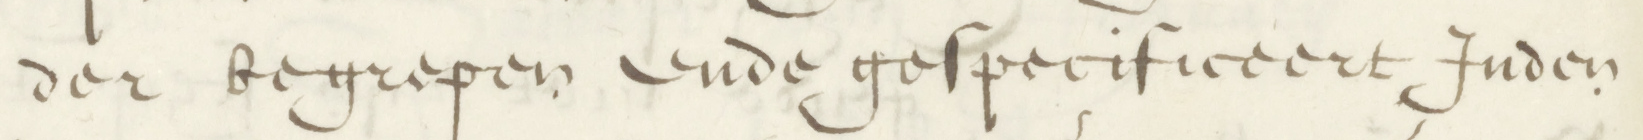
der begrepen ende gespecificeert Inden
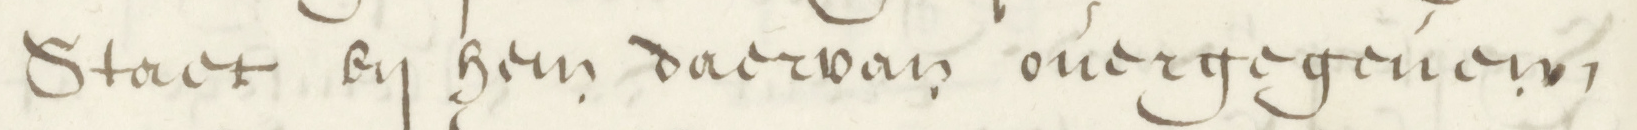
Staet by hem daervan ouergegeuen,
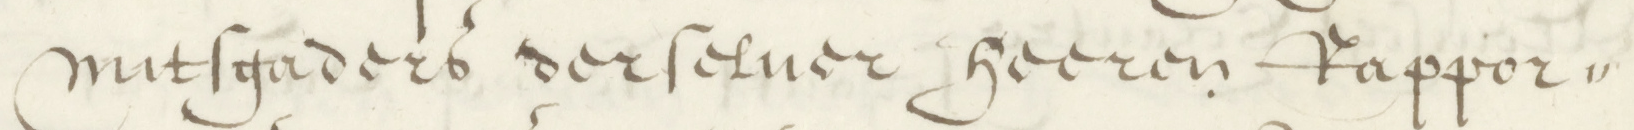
mitsgaders derseluer heeren Rappor,,
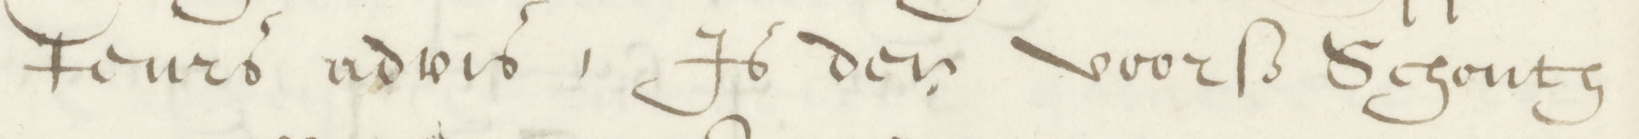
teurs advis. Is den voors Schouth
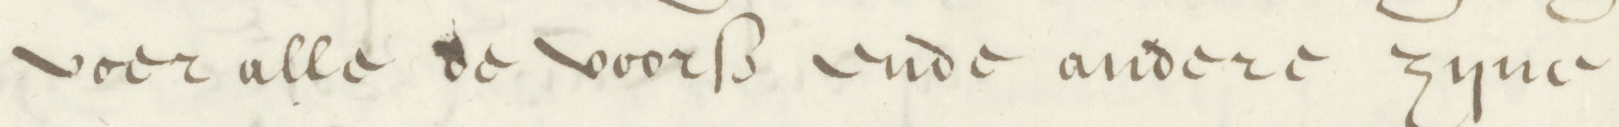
voer alle de voors ende andere zyne
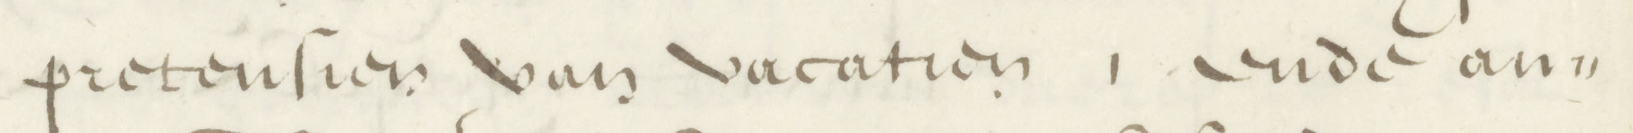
pretensien van vacatien, ende an,,
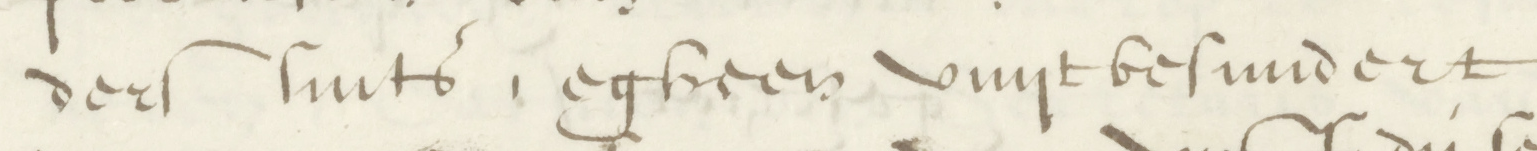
derssints, egheen vuytbesundert
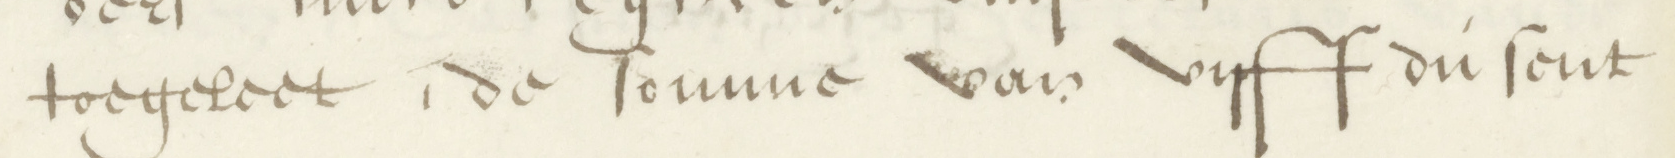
toegeleet, de somme van vyffdusent
